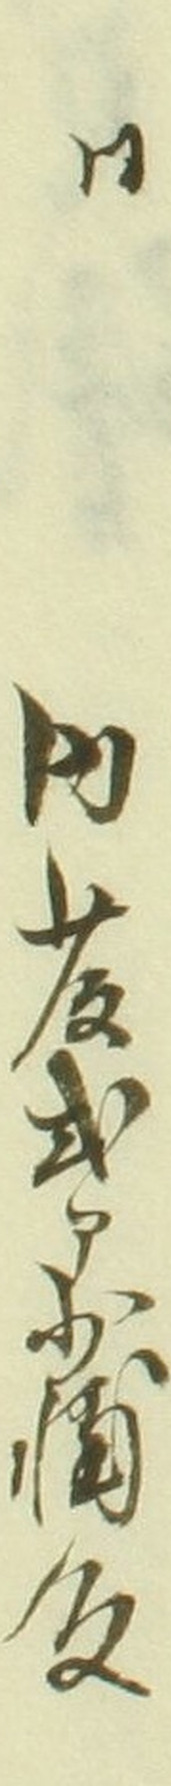同内藤式部少輔殿
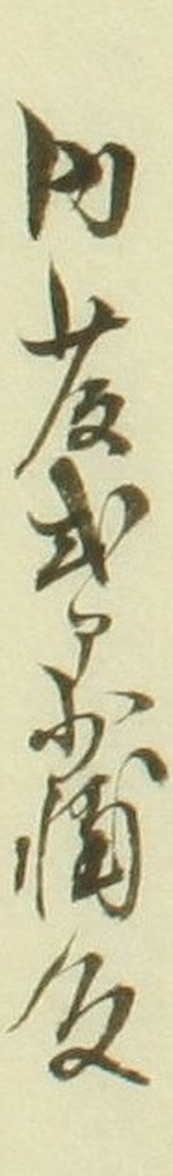同内藤式部少輔殿
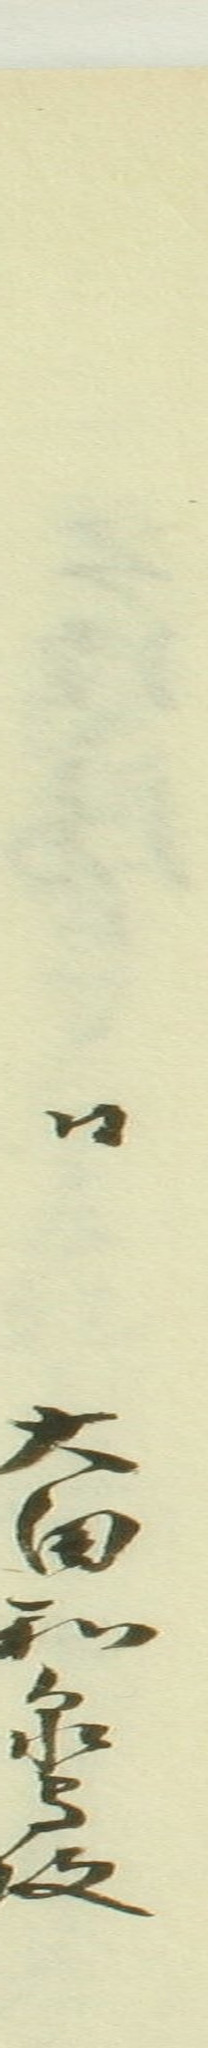同大田和泉守殿
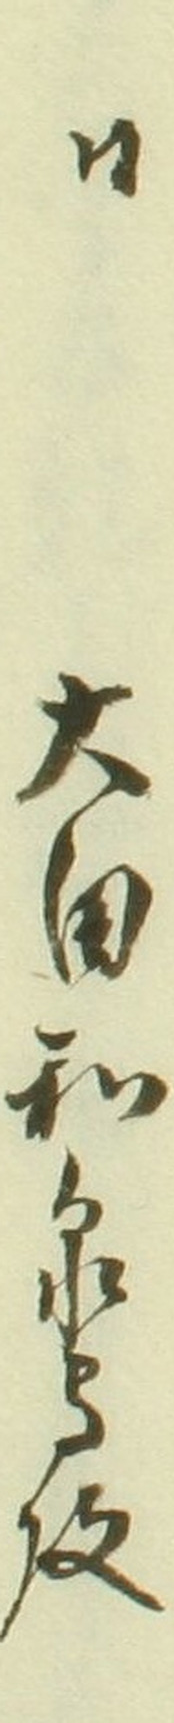同大田和泉守殿
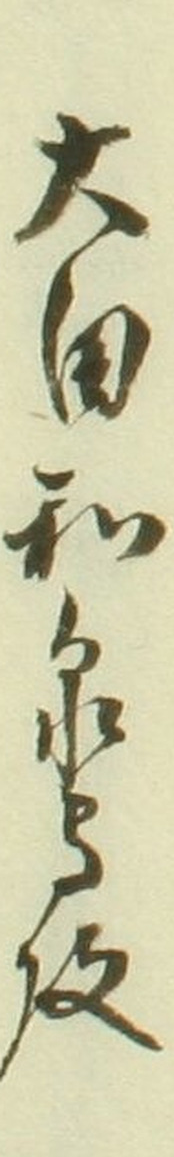同大田和泉守殿
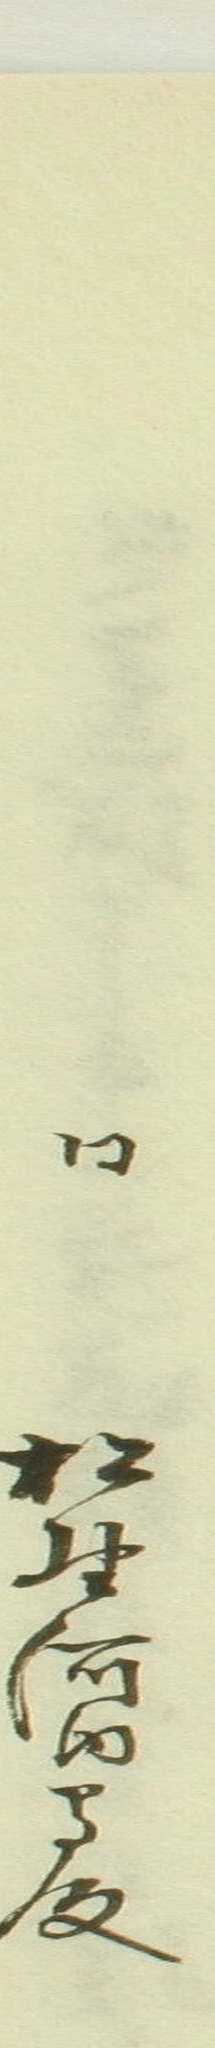同松野河内守殿
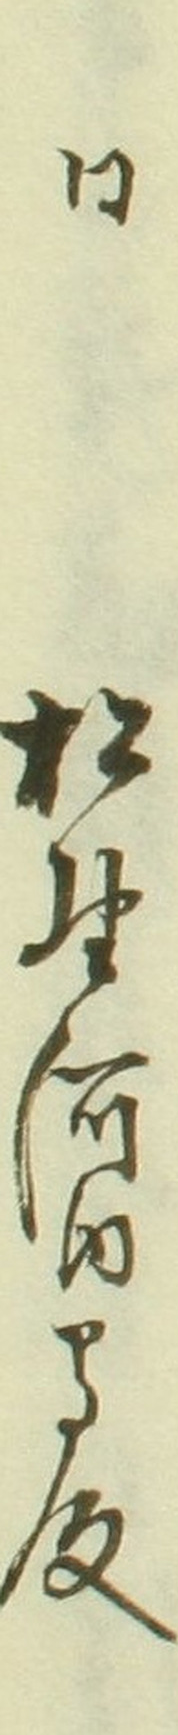同松野河内守殿
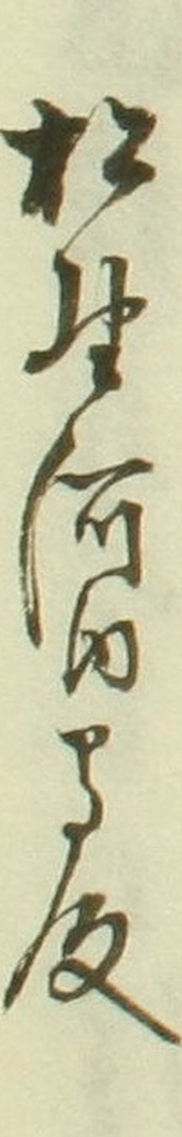同松野河内守殿
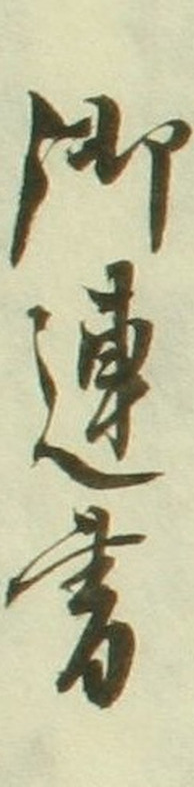御連書
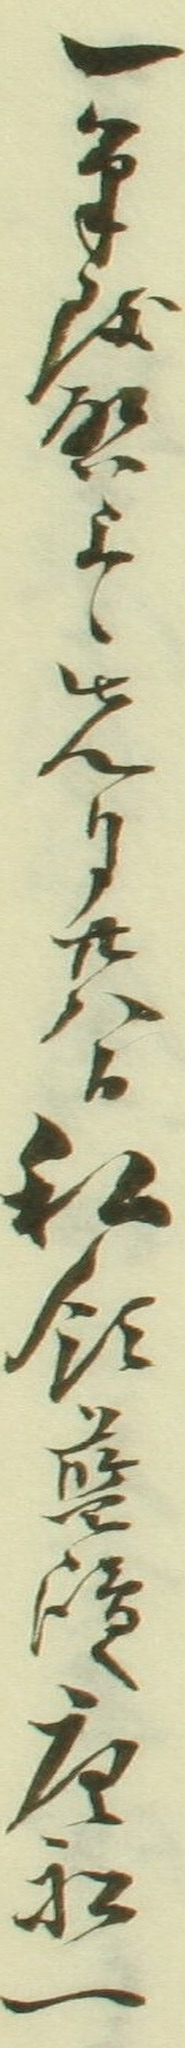一筆致啓上候先月廿八日私領藍嶋へ唐船一
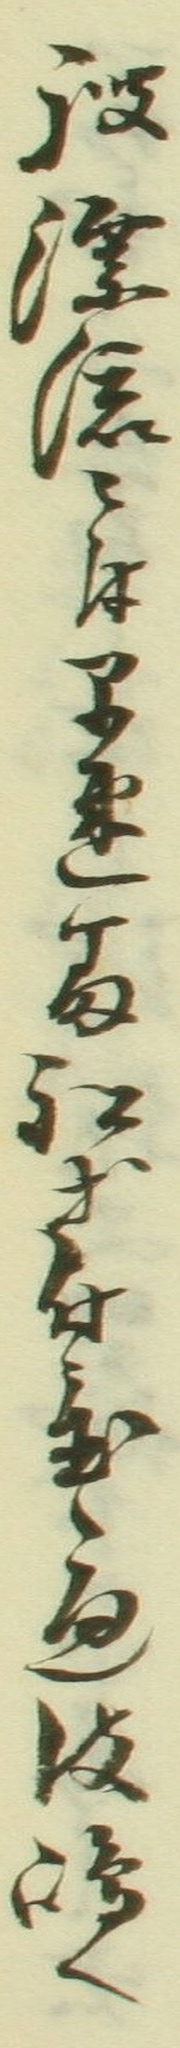艘漂着ニ付早速番船等付置候通波嶋へ

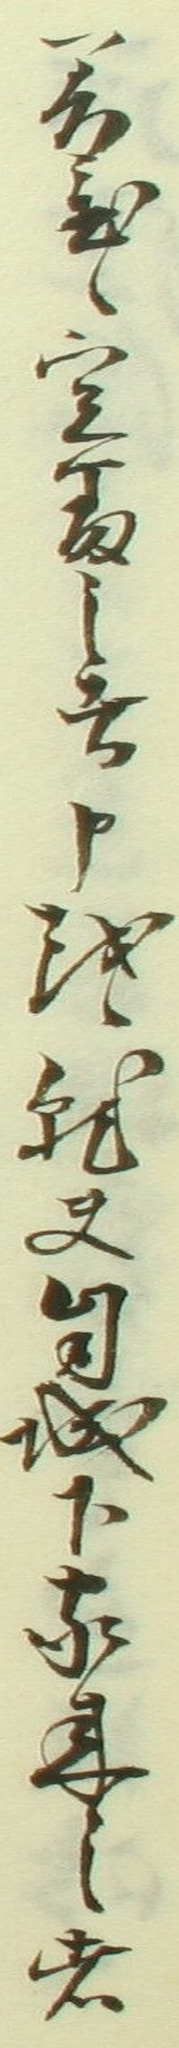差置候定番之者申越候就夫自城下家来之者
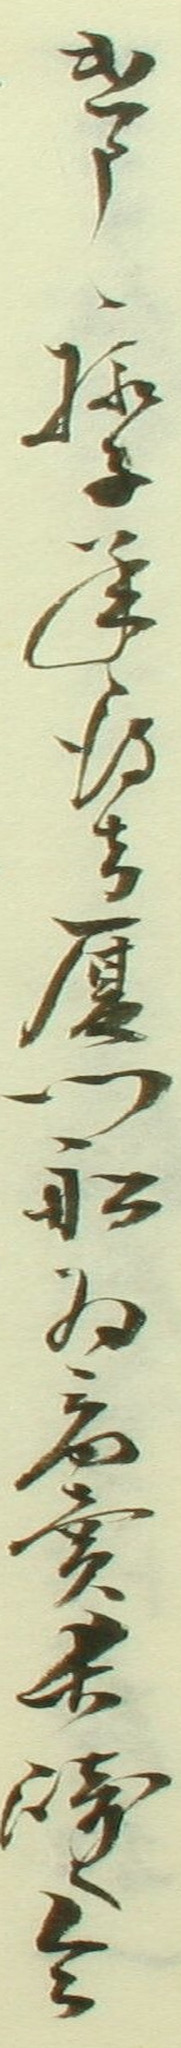遣申候様子承候得者為商売長崎へ令
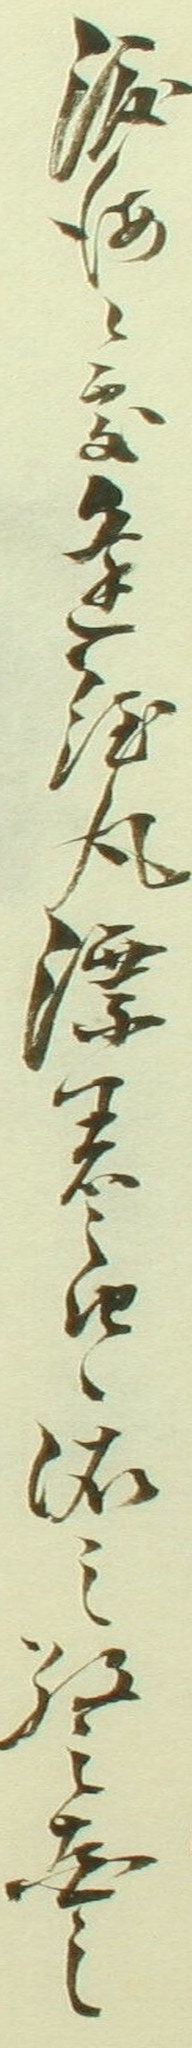渡海候処逢難風漂着之由候依之警固之
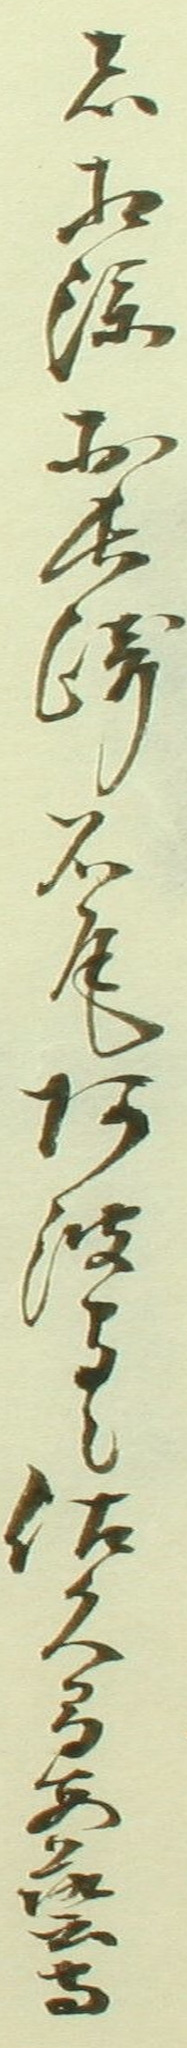者相添於長崎石尾阿波守様佐久間安芸守
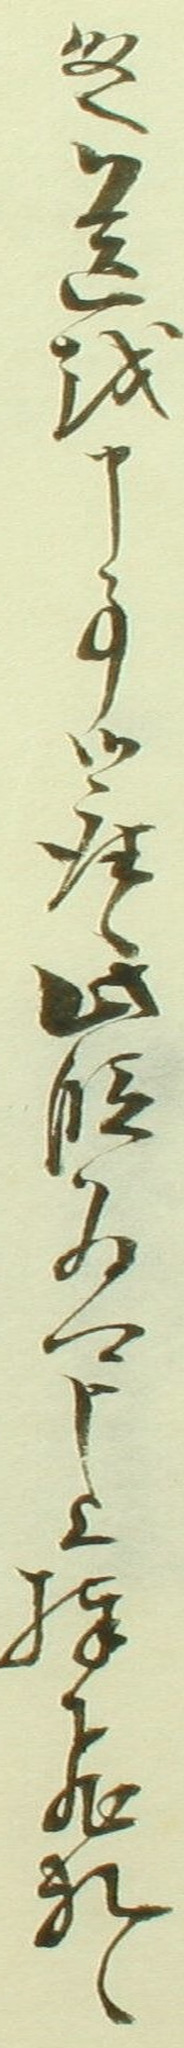殿へ送越申事御座候此段為可申上捧飛札候
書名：異国船漂着記
